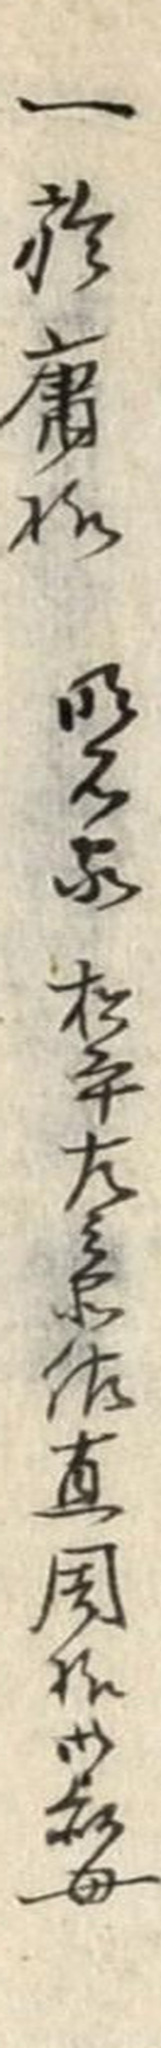一御庸様明石家松平左兵衛佐直周様御叔母
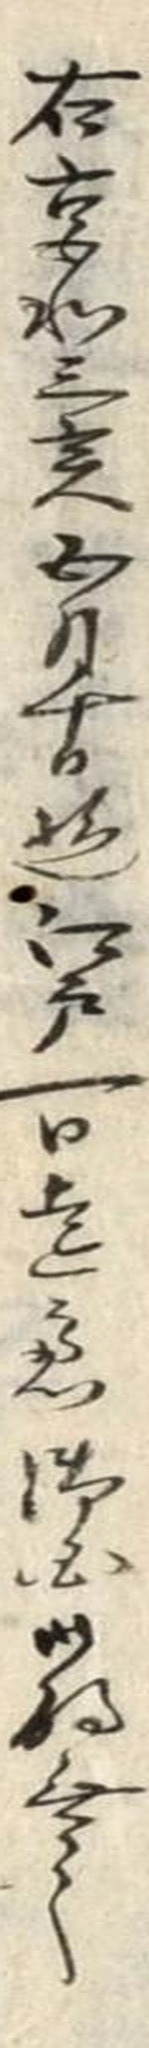右享和三亥五月十日逝江戸一日遠慮御国御触無之
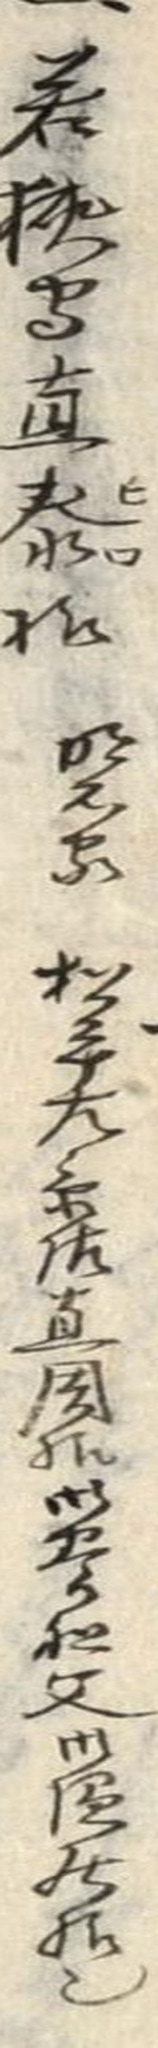一若狭守直泰明石家松平左兵衛佐直周様御養祖父御隠居様也
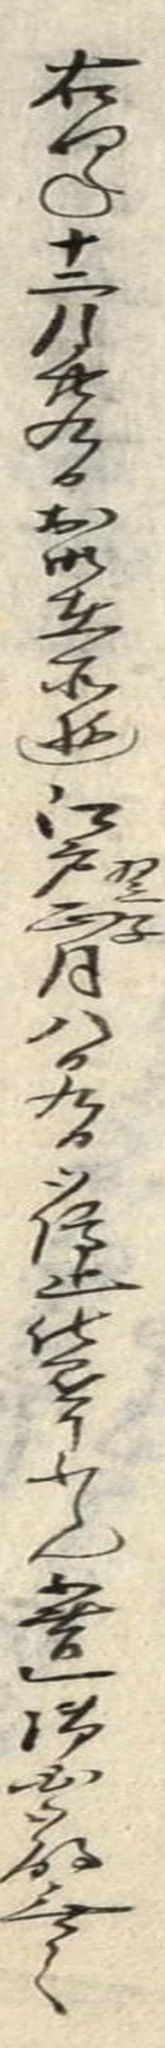右同年十二月廿九日於御在所逝江戸正翌子月八日九日御停止仕懸りふしん不苦」御国御触無之
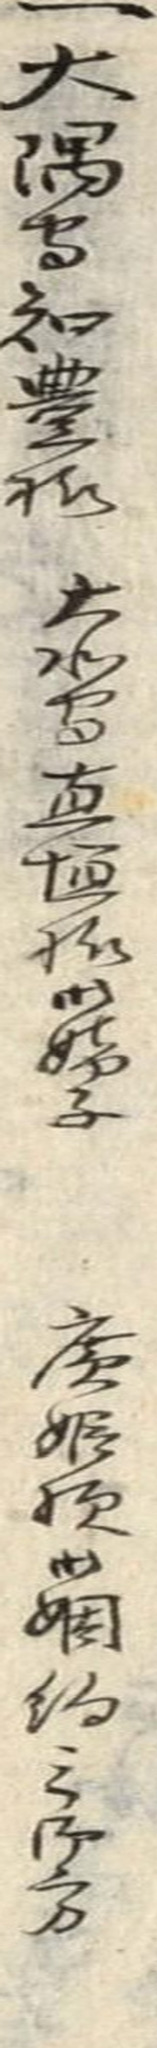一大隅守知豊様大和守直恒様御嫡子広姫様御姻約之御方
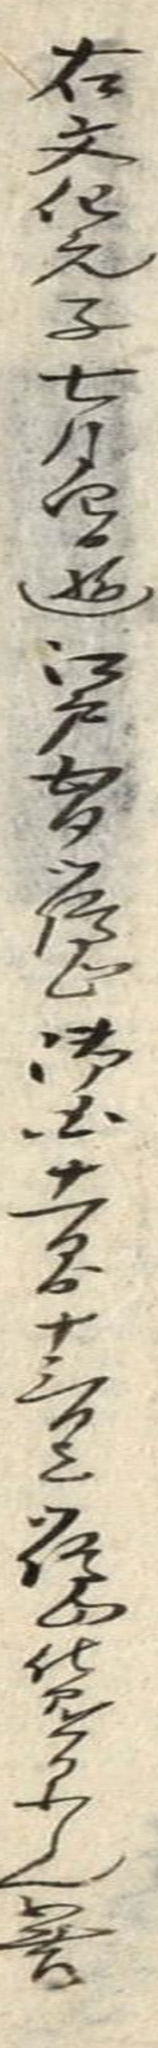右文化元子七月四日逝江戸五日御停止御国十一日ゟ十三日迄御停止仕懸りふしん不苦
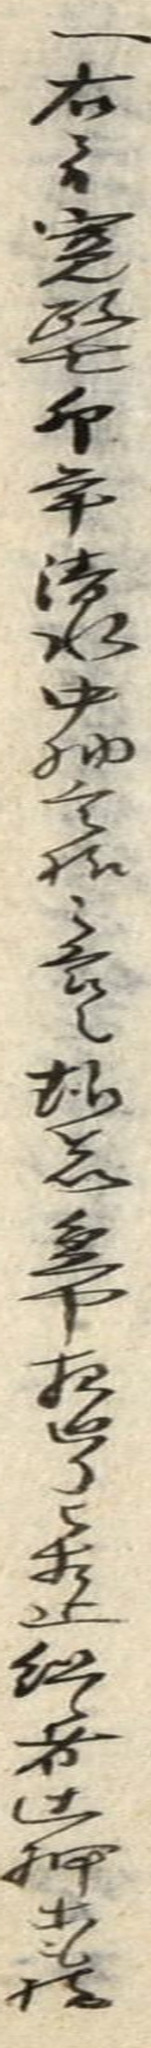一右に付寛政七卯年清水中納言様之節之趣を以盆中夜廻り被相止組之者辻押等も指
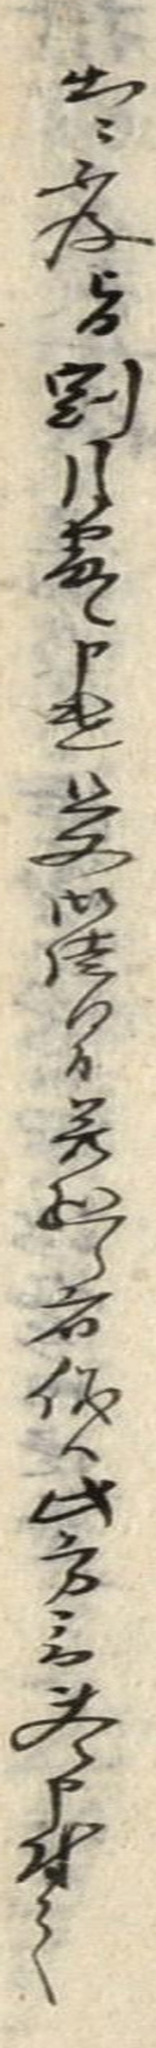出に不及旨割月番へ申遣且又御徒目付并組之者儀は此方にて夫々申付之

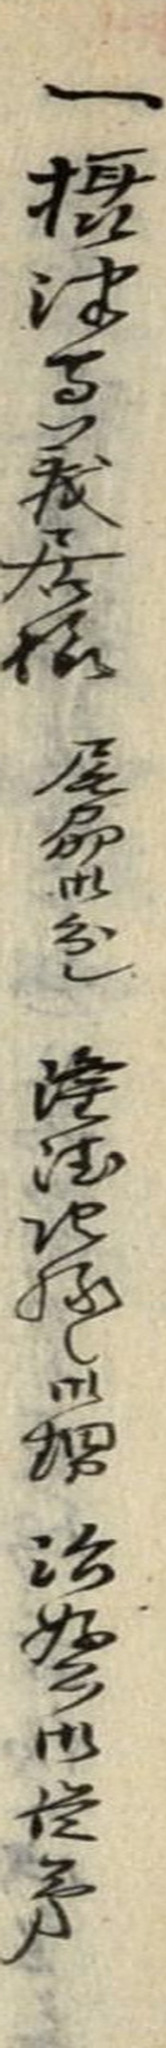一摂津守義居様尾州御分也隆徳院様之御甥治好公御従弟
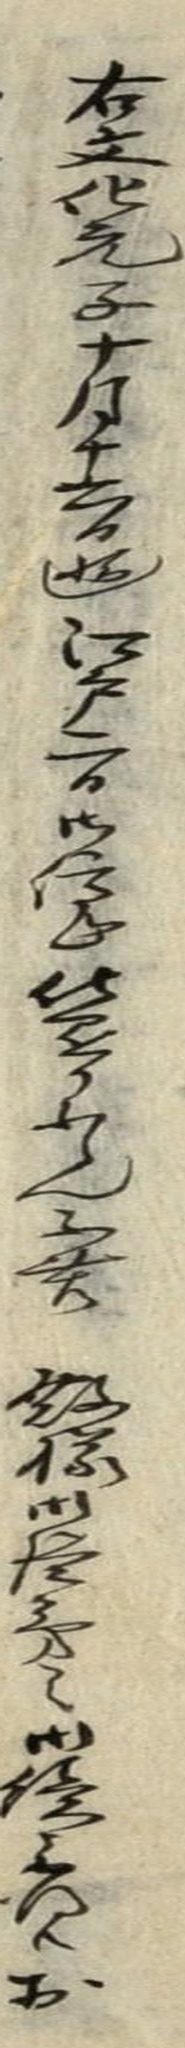右文化元子十月十六日逝江戸二日御停止仕懸りふしん不苦殿様御従弟之御続に候得共於
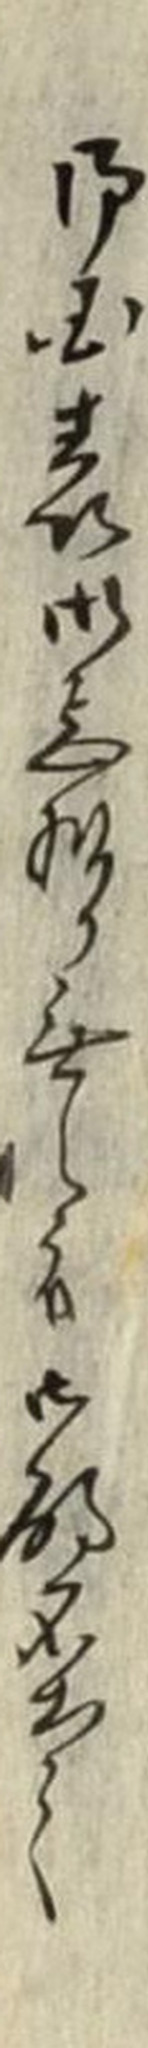御国表御忌掛り無之に付御触不出之
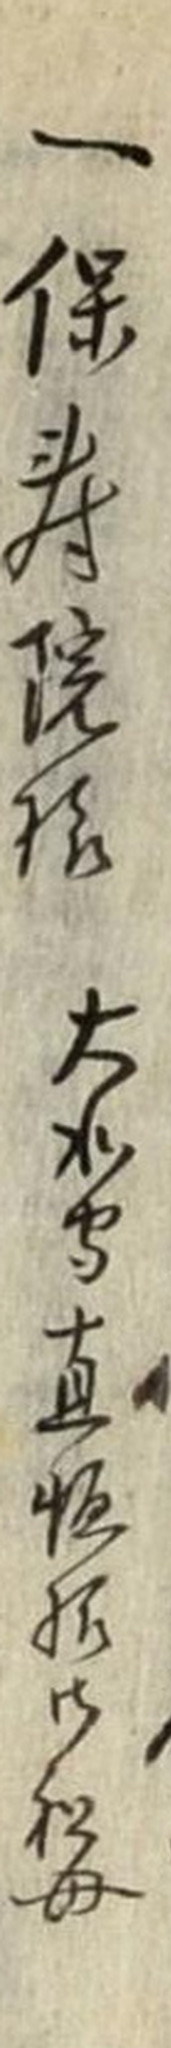一保寿院様大和守直恒様御祖母
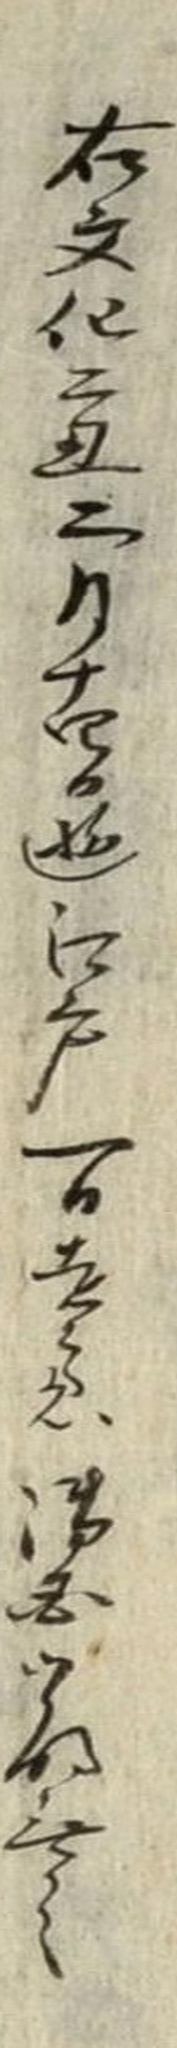右文化二丑二月十四日逝江戸一日遠慮御国御触無之
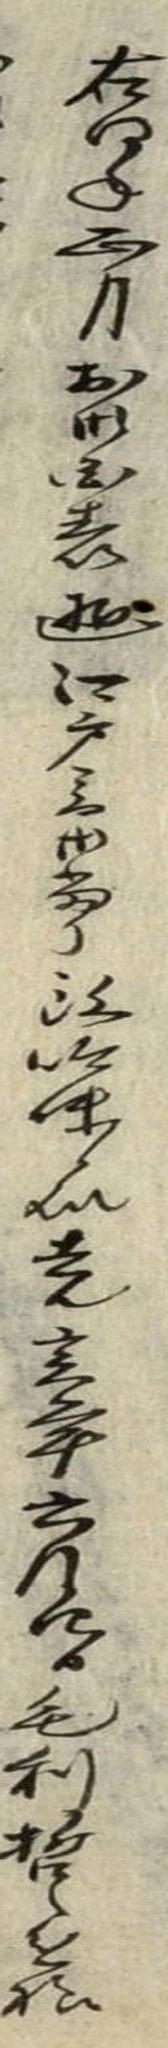右同年正月於御国表逝江戸にて御当り致吟味候処去ル亥年六月四日毛利哲之進様
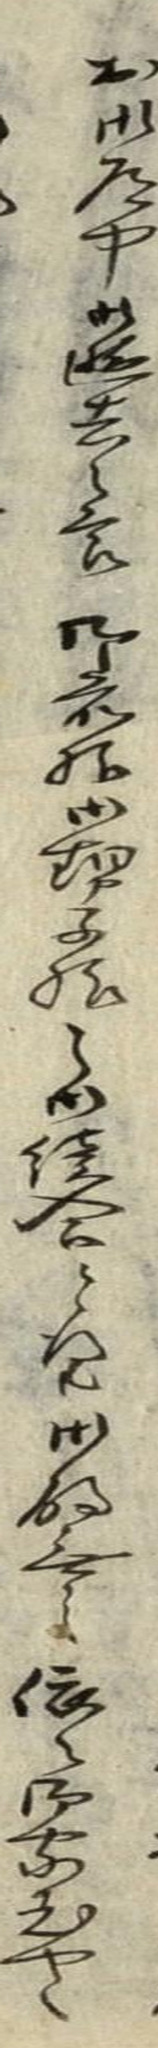於御道中御逝去之節御前様御甥子様之御続合に候得共御触無之依之御家老中へ
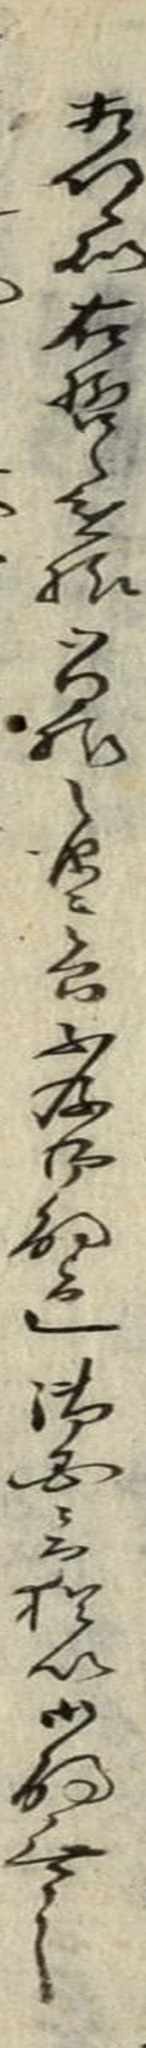相伺候処右哲之進様御同様之儀に候間不及御触旨」御国にて猶以御触無之
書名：御停止異変死失
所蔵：福井県文書館 Fukui Prefectural Archives
